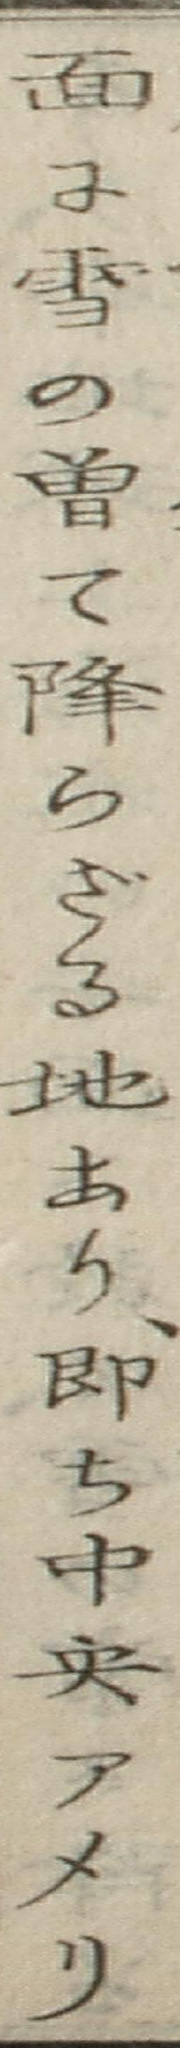面に雪の曾て降らざる地あり、即ち中央アメリ
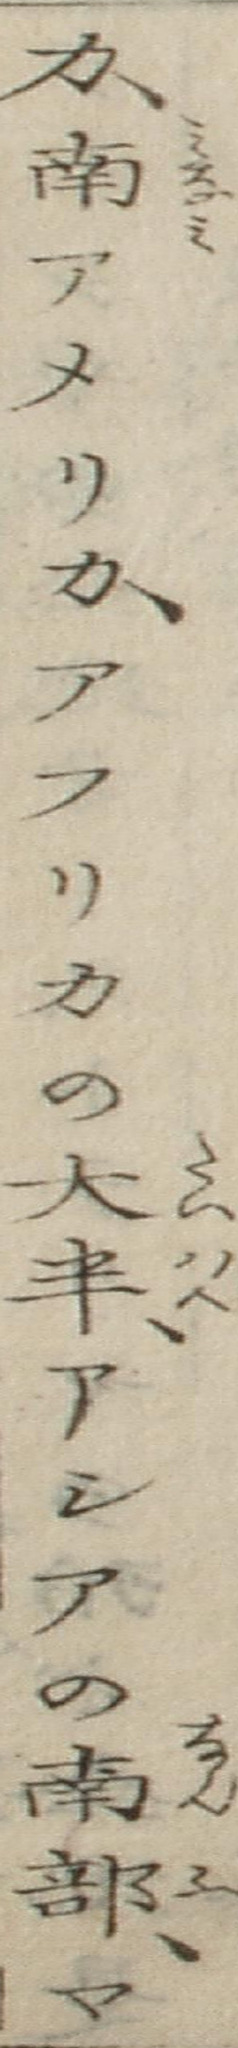カ、南アメリカ、アフリカの大半、アシアの南部、マ

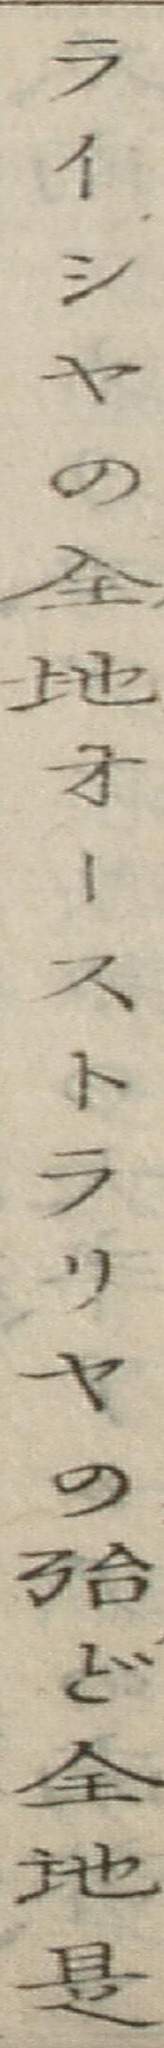ライシヤの全地、オーストラリヤの殆全地是
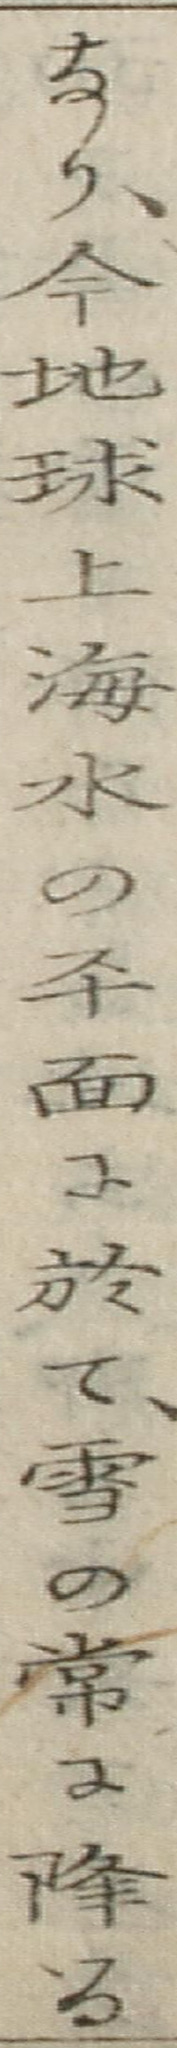なり、今地球上海水の平面に於て、雪の常に降る
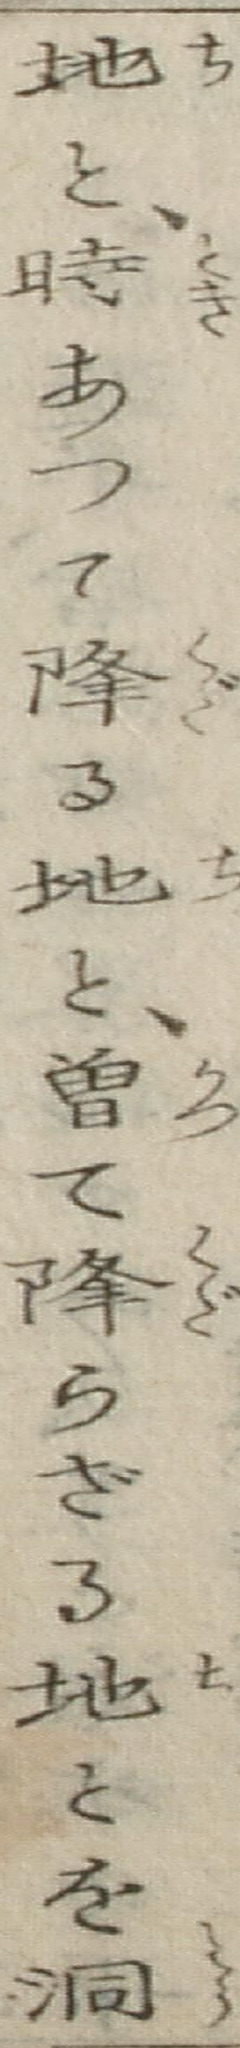地と、時あつて降る地と、曾て降らざる地とを洞
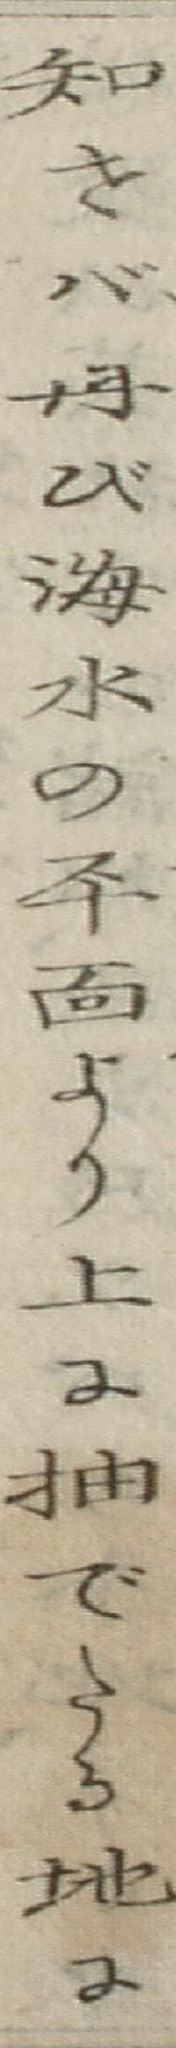知せば、再び海水の平面より上に抽でたる地に
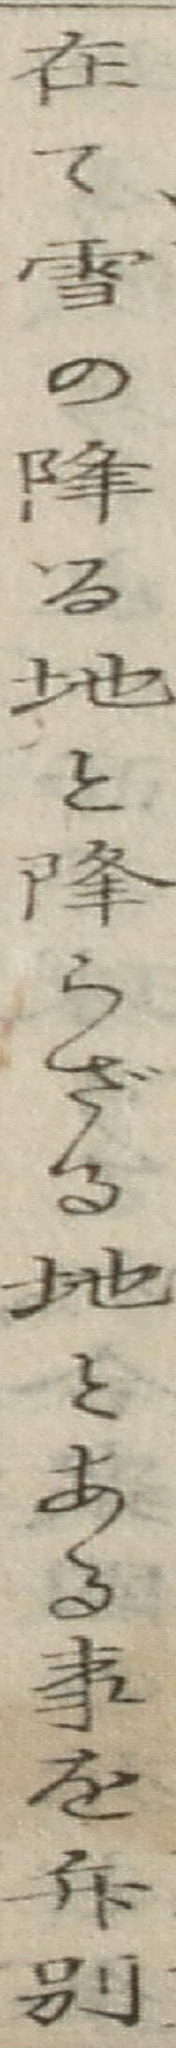在て、雪の降る地と降らざる地とある事を弁別
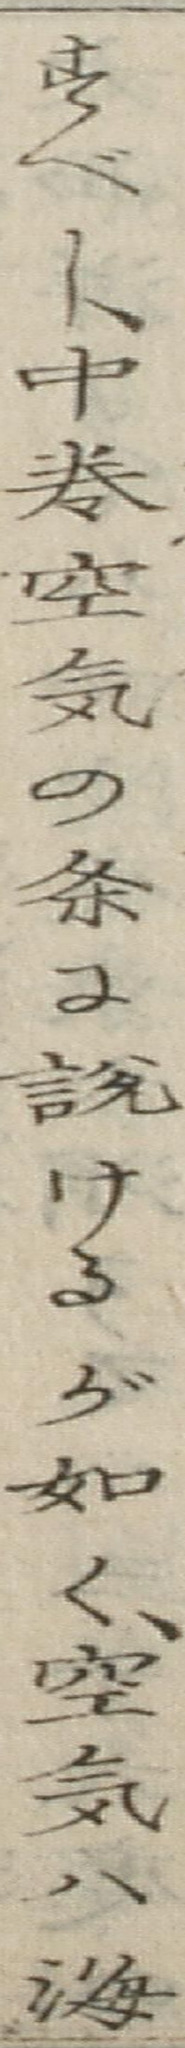すべし、中巻空気の条に説けるが如く、空気は海
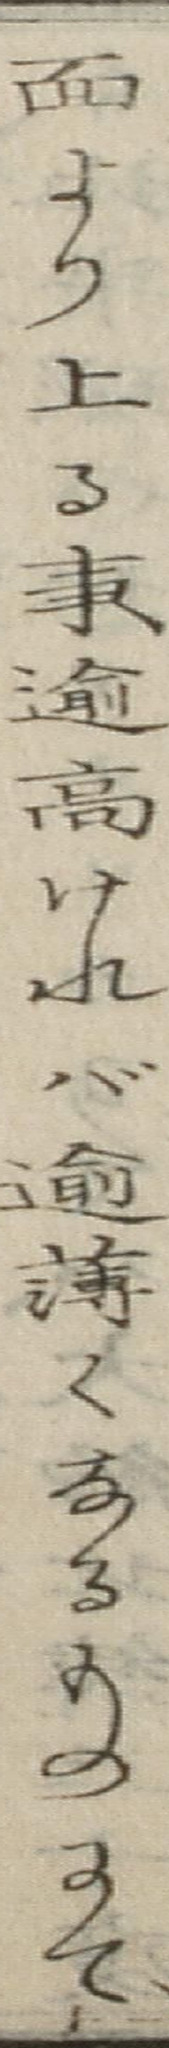面より上る事、愈高ければ愈薄くなるものにて、
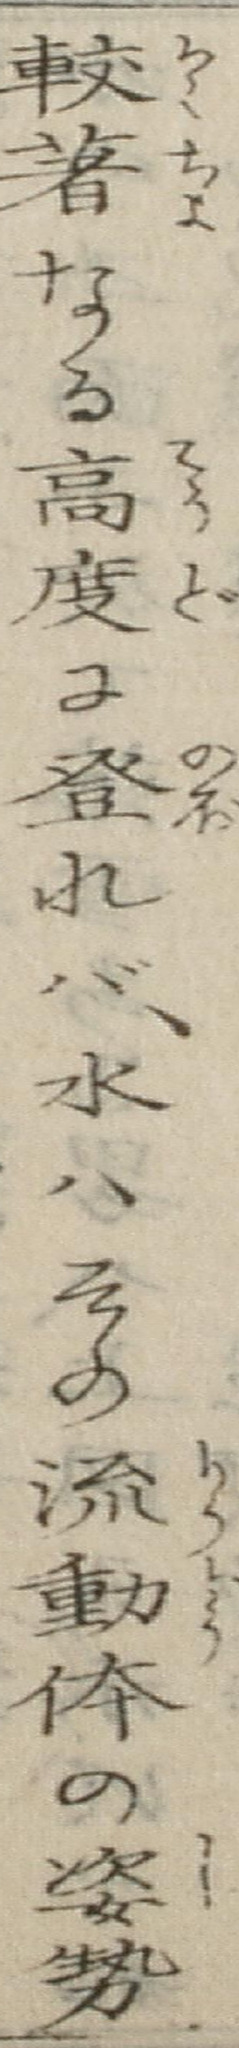較著なる高度に登れば、水はその流動体の姿勢
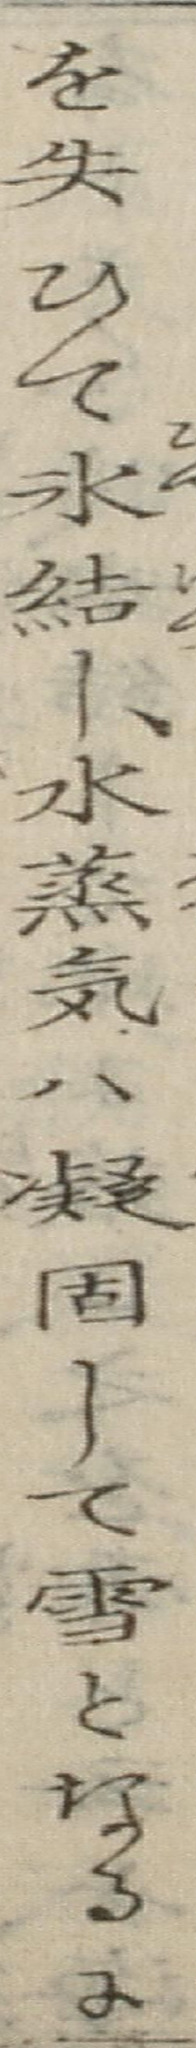を失ひて氷結し、水蒸気は凝固して雪となるに
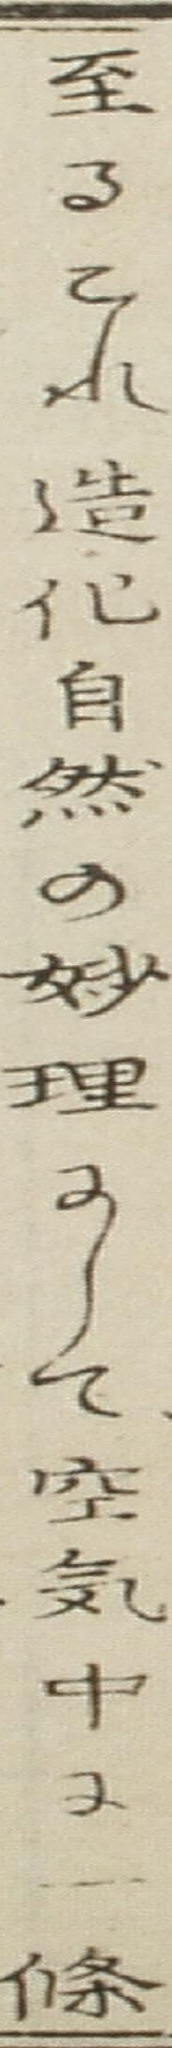至る、これ造化自然の妙理にして、空気中に一条
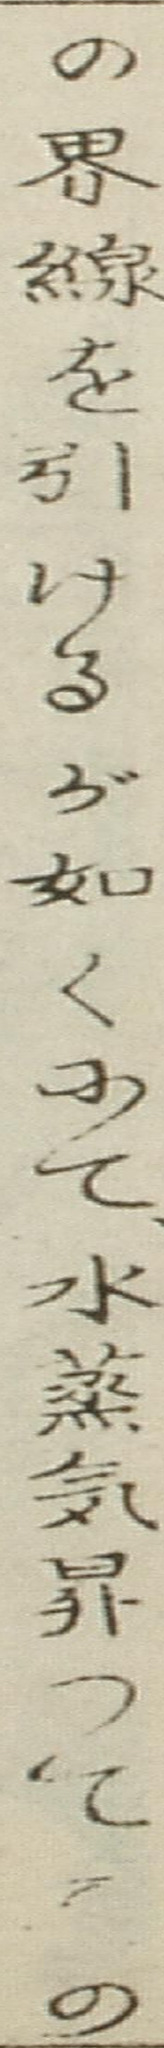の界線を引けるが如くにて、水蒸気昇つてこ？の
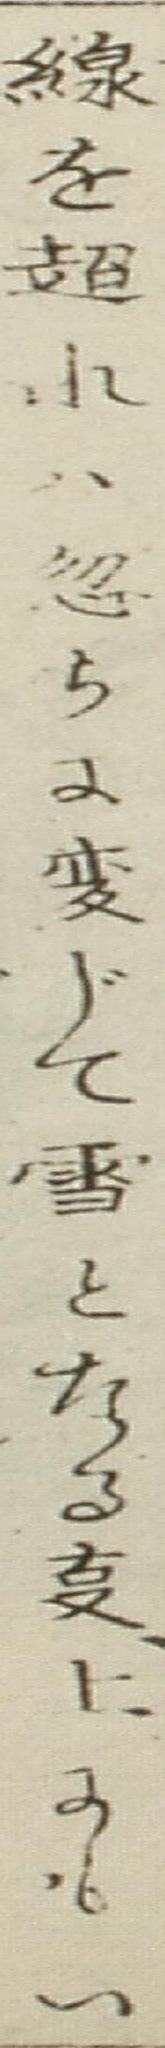線を超れば忽ちに変じて雪となる事、上にもい
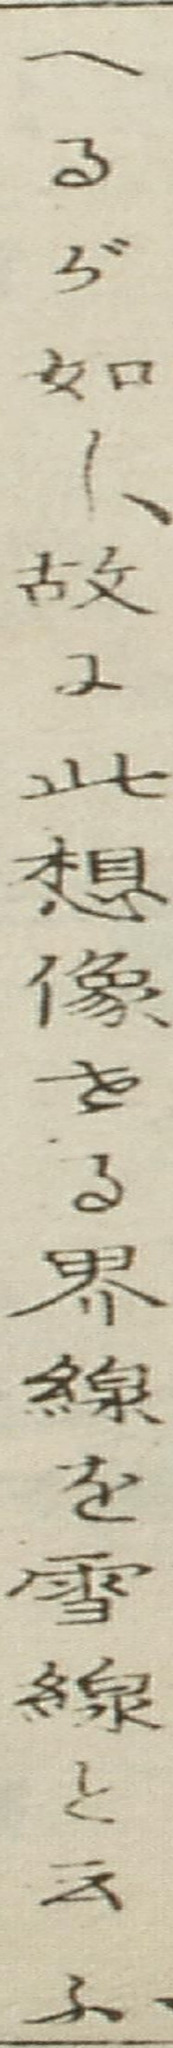へるが如し、故に此想像せる界線を雪線と云ふ、
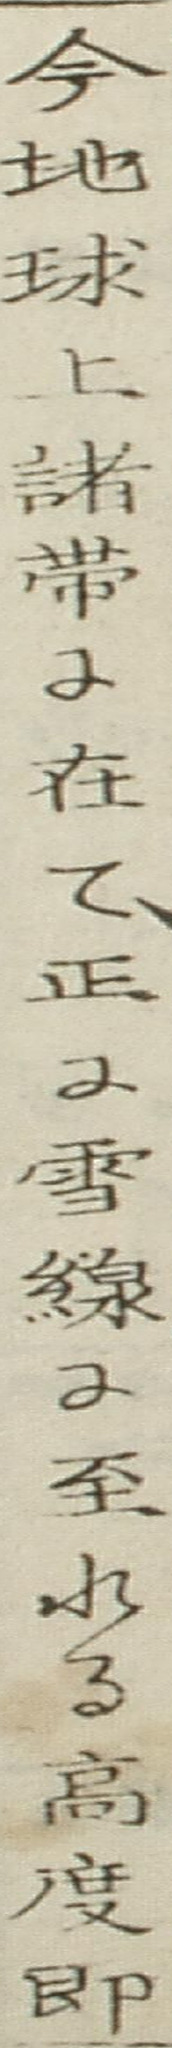今地球上諸帯に在て、正に雪線に至れる高度即
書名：訓蒙　天然地理學　下
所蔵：東京大学地震研究所図書室 Earthquake Research Institute Library, The University of Tokyo, JAPAN
